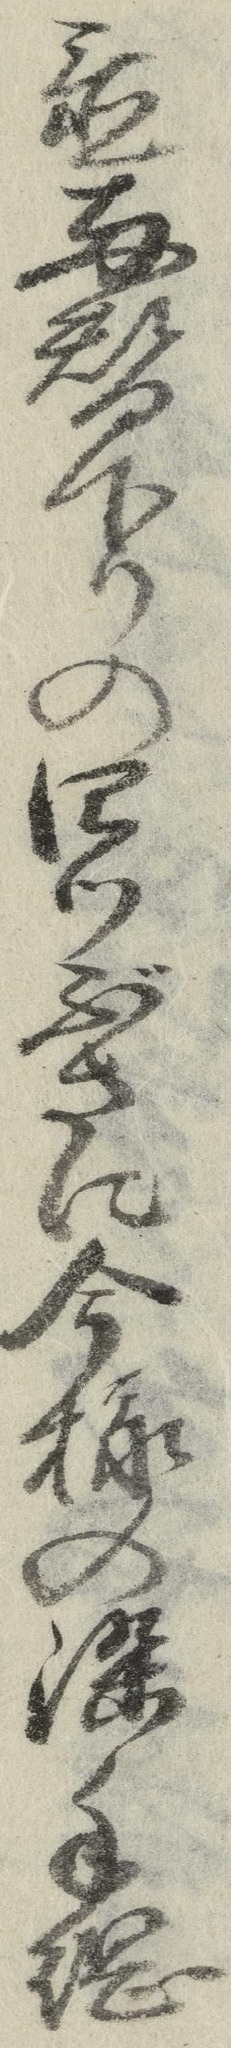置両替下りの四つぶさに今様の染手綱
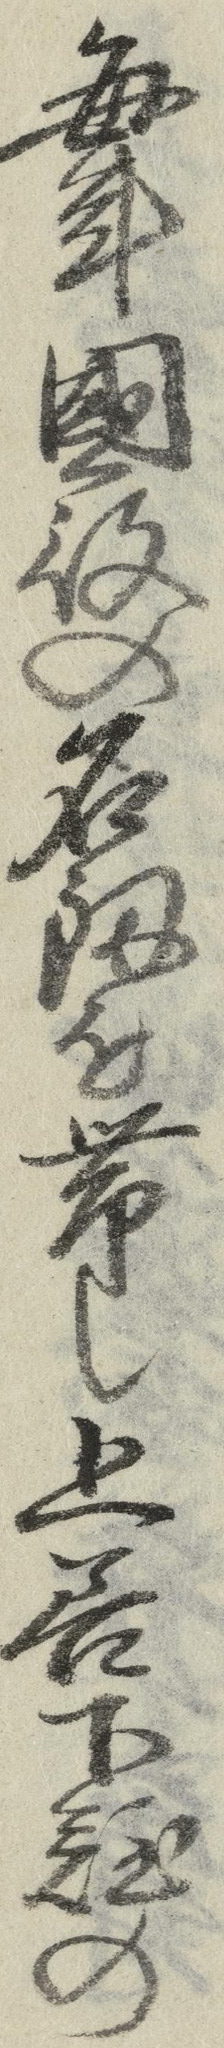毎年国役の名釖を常し上善下難の
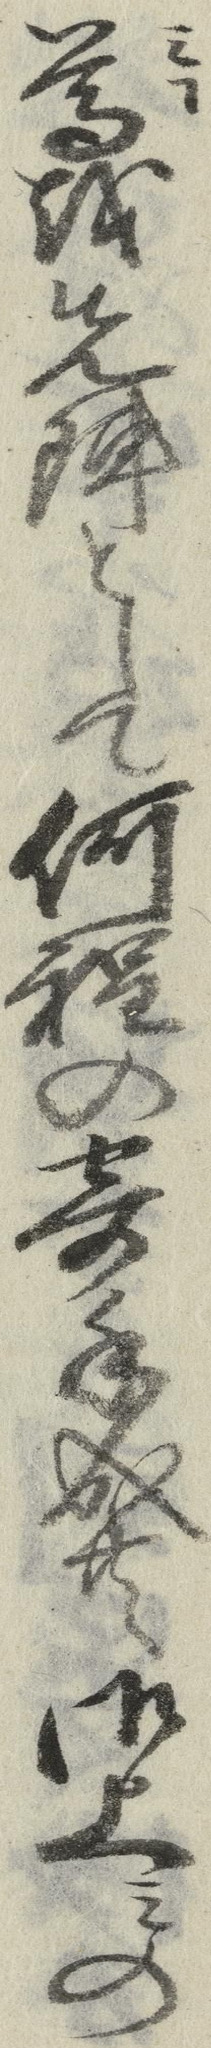尊を先陣として何程の寄手成共御上
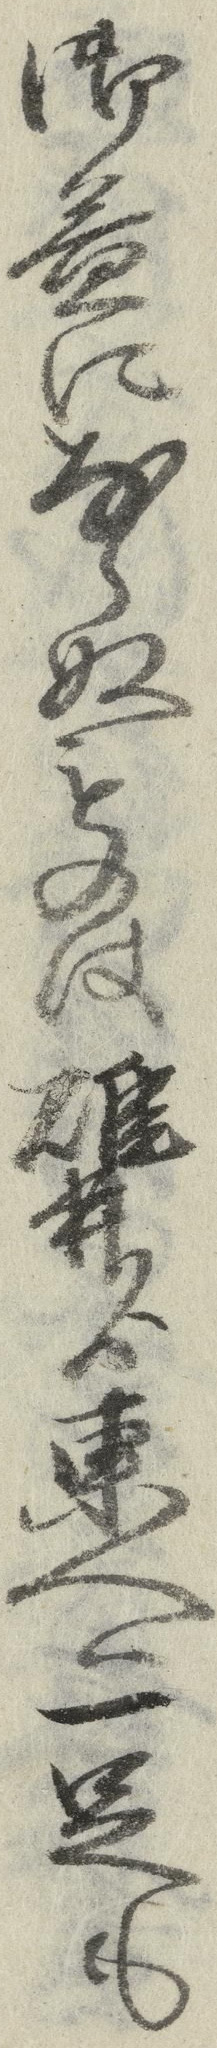御益にならぬものは碓井ゟ東へは一足も
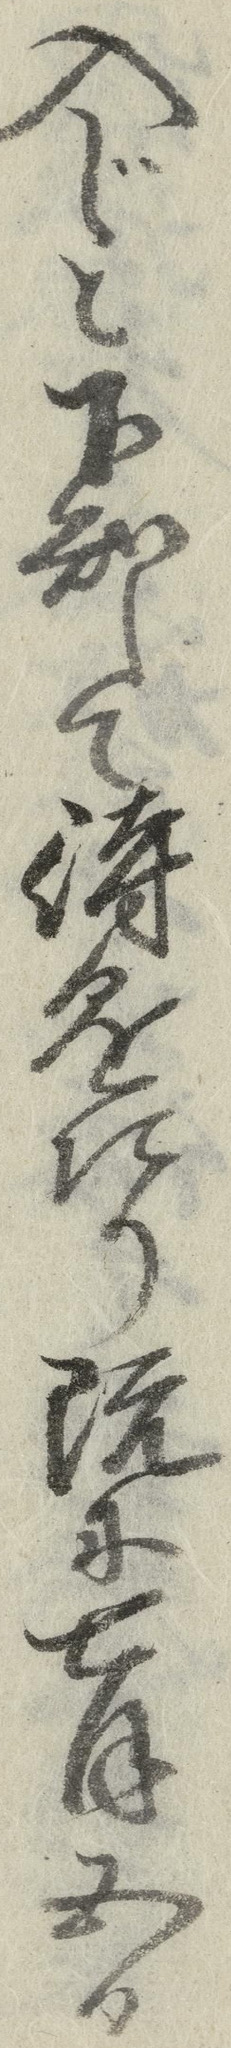入じと下知して待懸たり既に七月五日
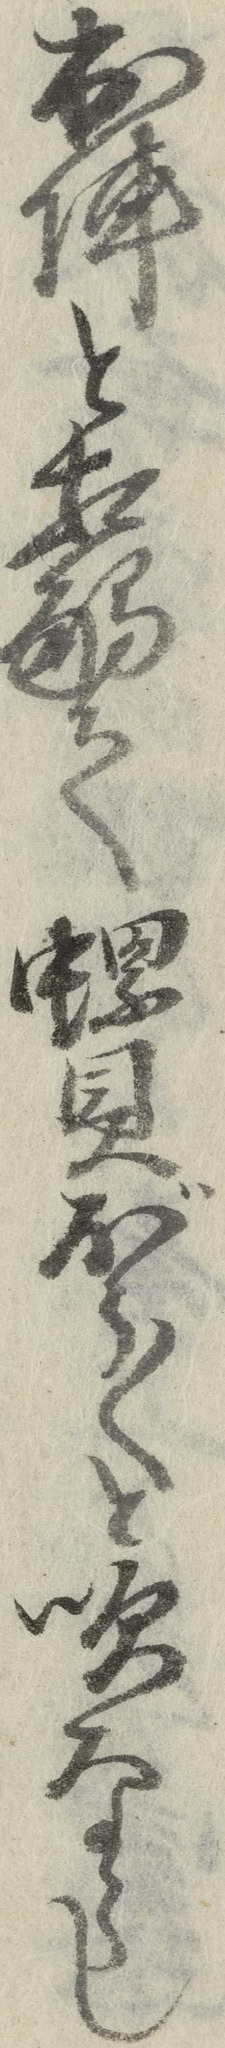出陣と相觸て螺貝ぼう〳〵と吹ならし
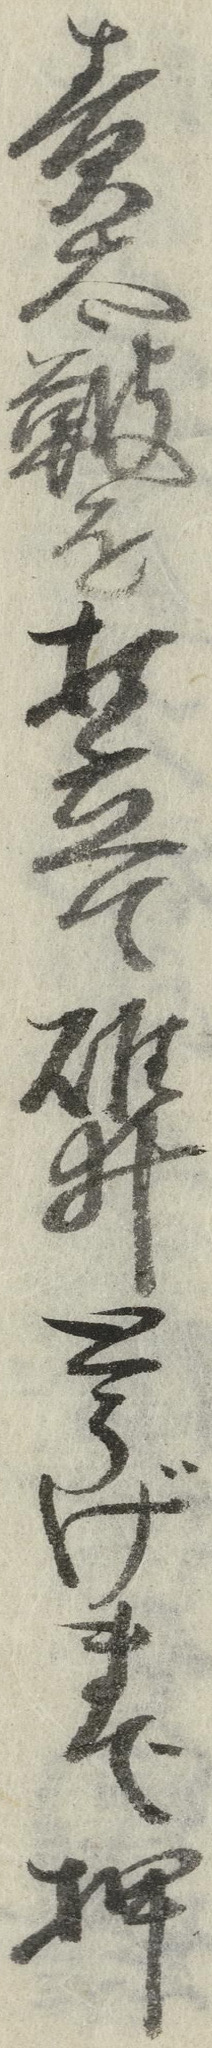責太鞁を打立て碓井とうげまで押
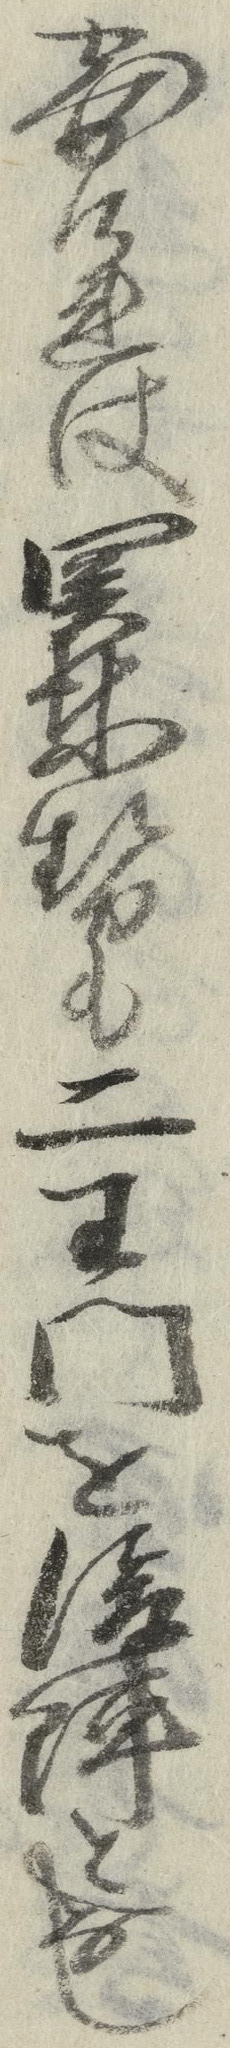寄けれは関東勢もニ王門を後陣となし
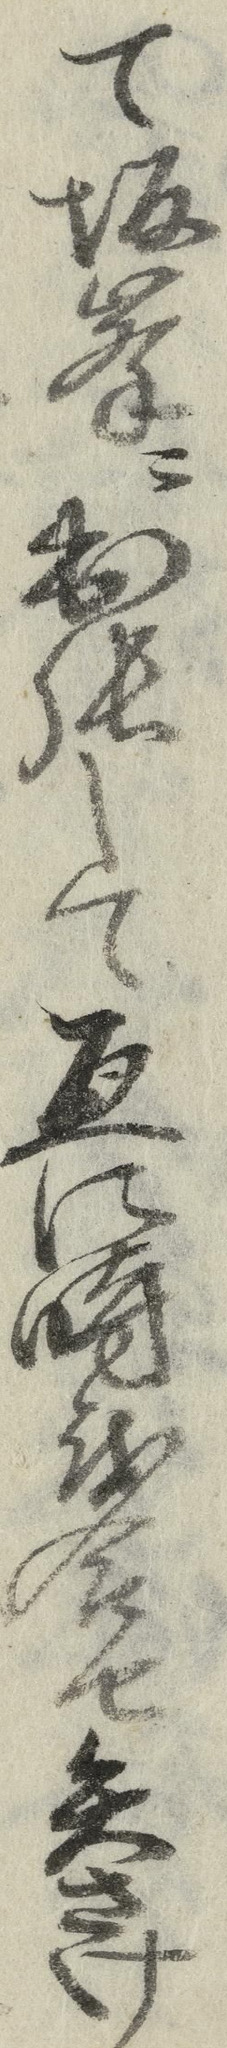て坂峯に出張して互に時を合せ矢さけ
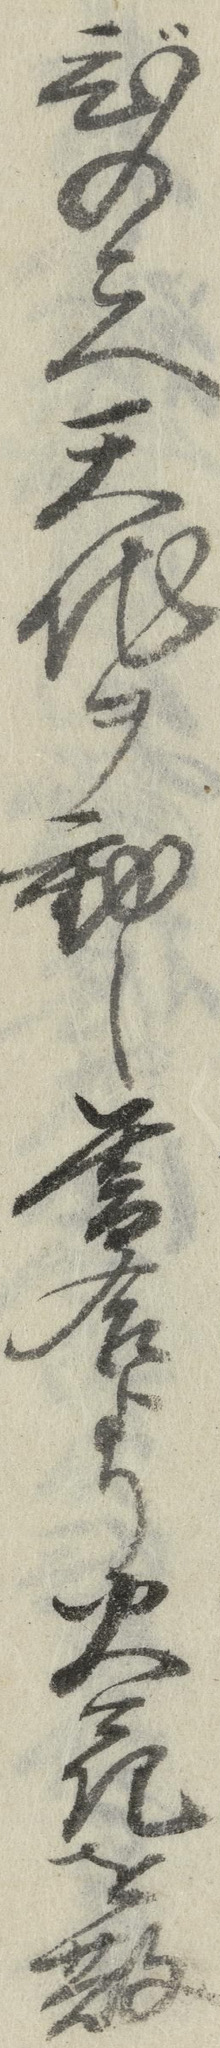びのこへ天地ヲ動し暮合より火花を散

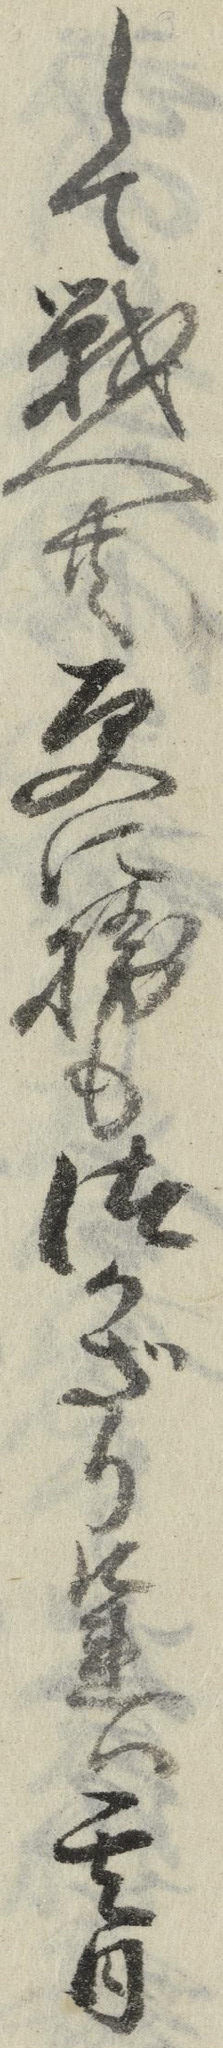して戦へ共更に勝もかざりけれは其日
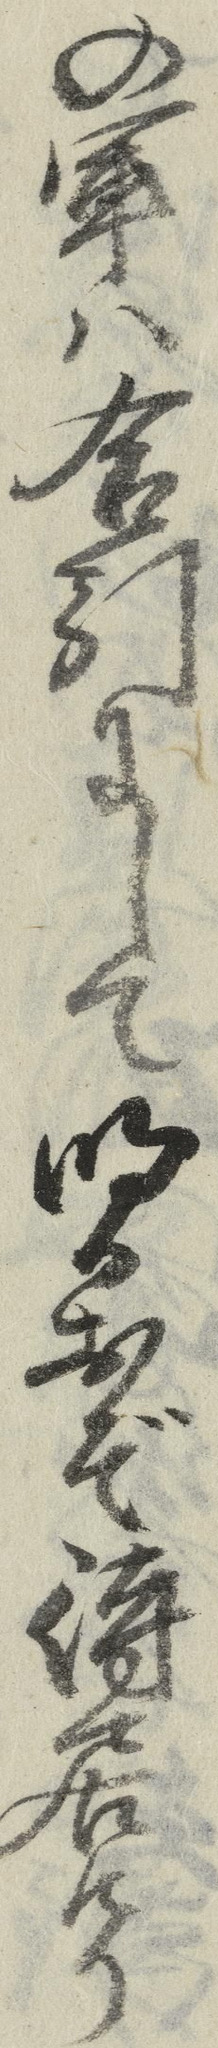の軍は合引にして明日ぞ待居けり
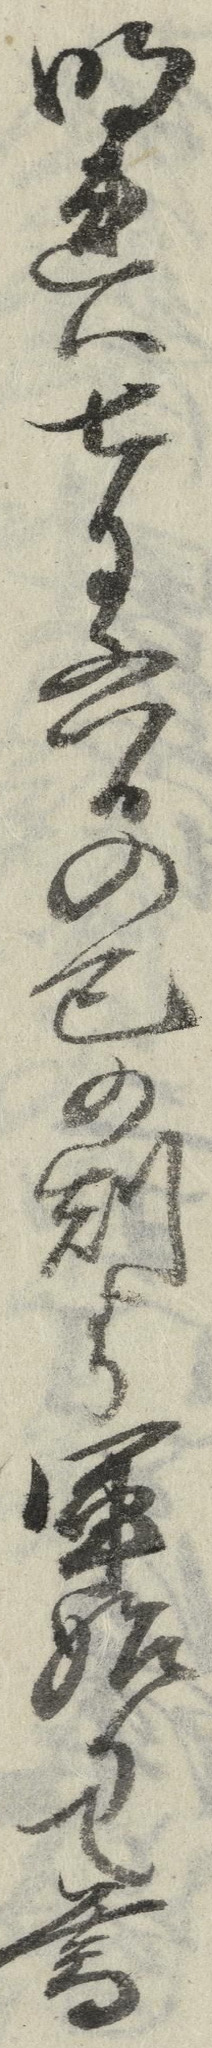明れは七月六日の己の刻より軍始りて暮
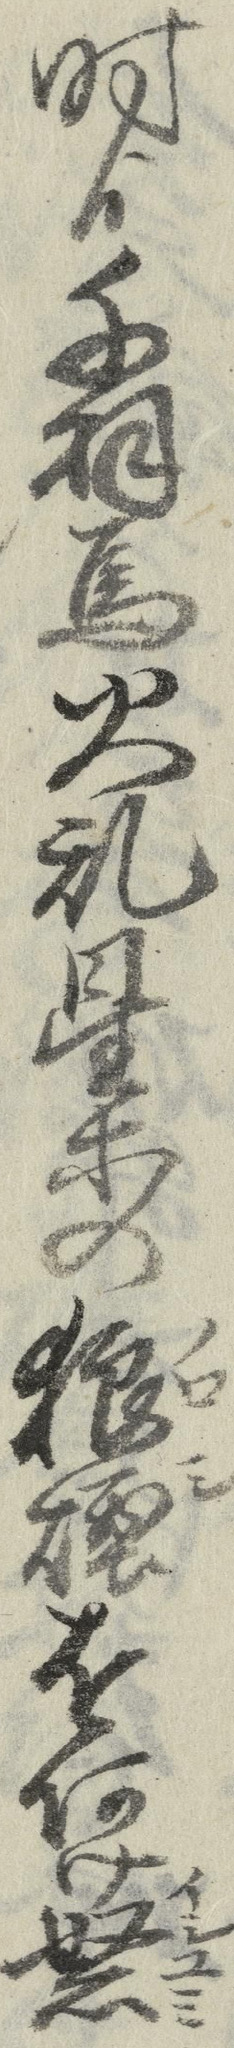時ゟ千羽馬火乱星等の狼煙をあけ弩
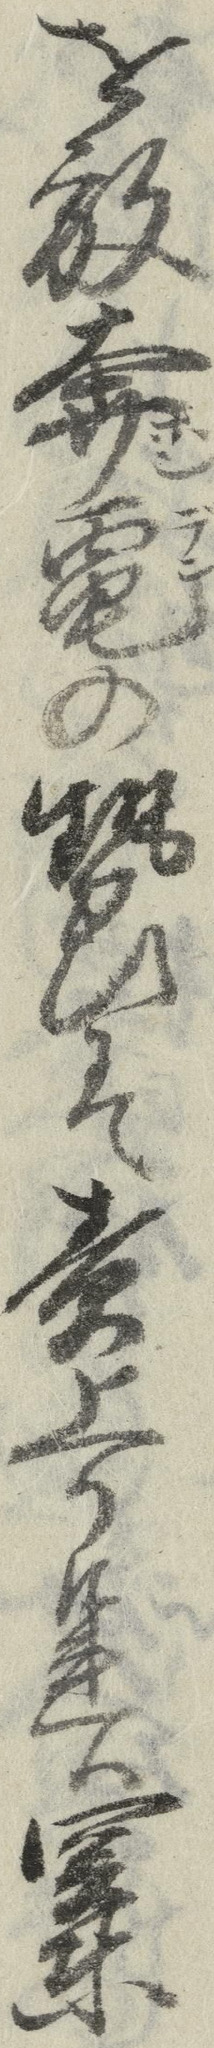を放奔電の勢ひにて責上りけれは関東
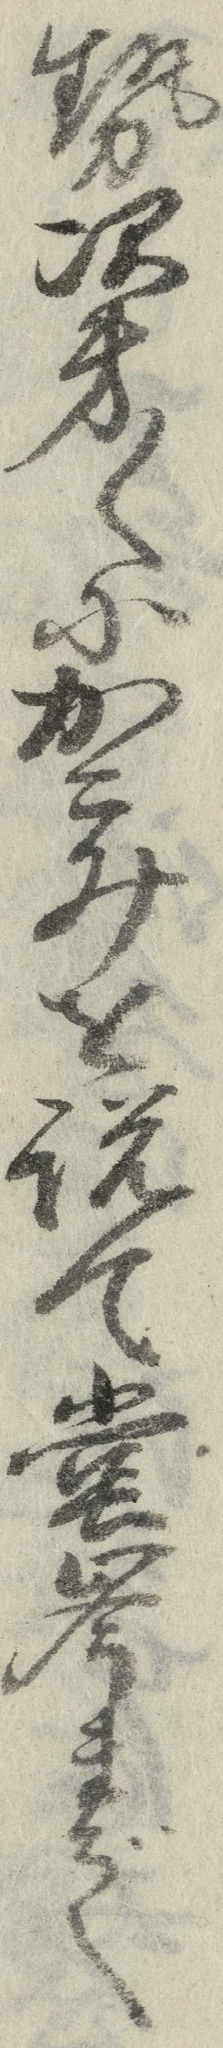勢次第〳〵にかこみを説て堂岑まで
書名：浅間大焼騒動記　上
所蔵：東京大学地震研究所図書室 Earthquake Research Institute Library, The University of Tokyo, JAPAN
